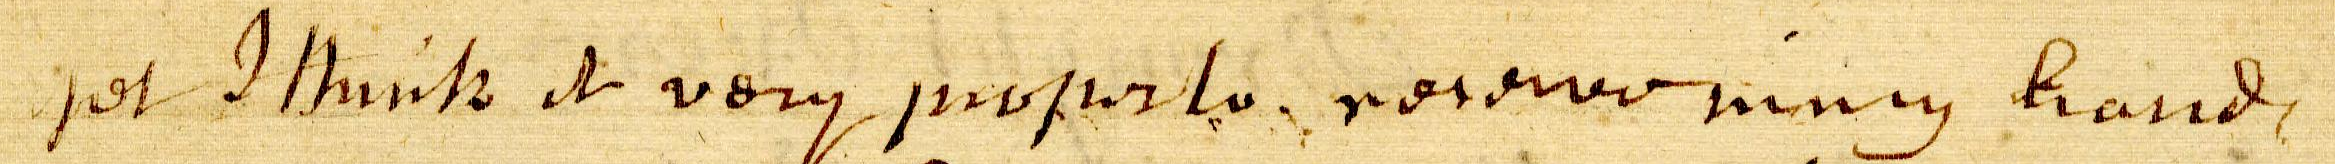yet I think it very proper to receive in my hands
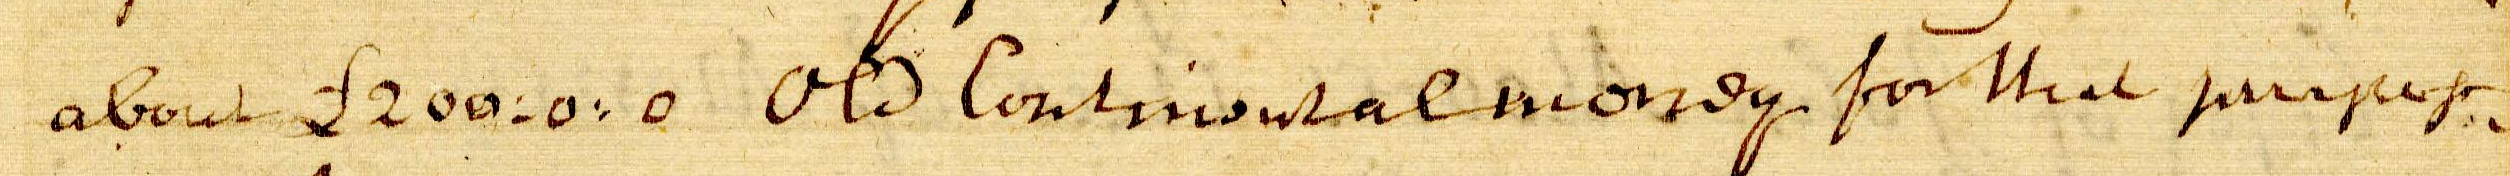about £200:0:0 Old Continental money for that purpose.
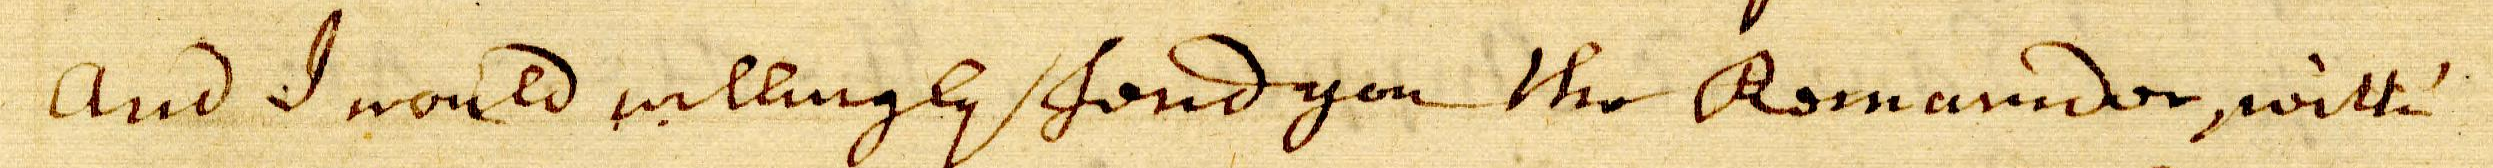And I would willingly send you the Remainder, with
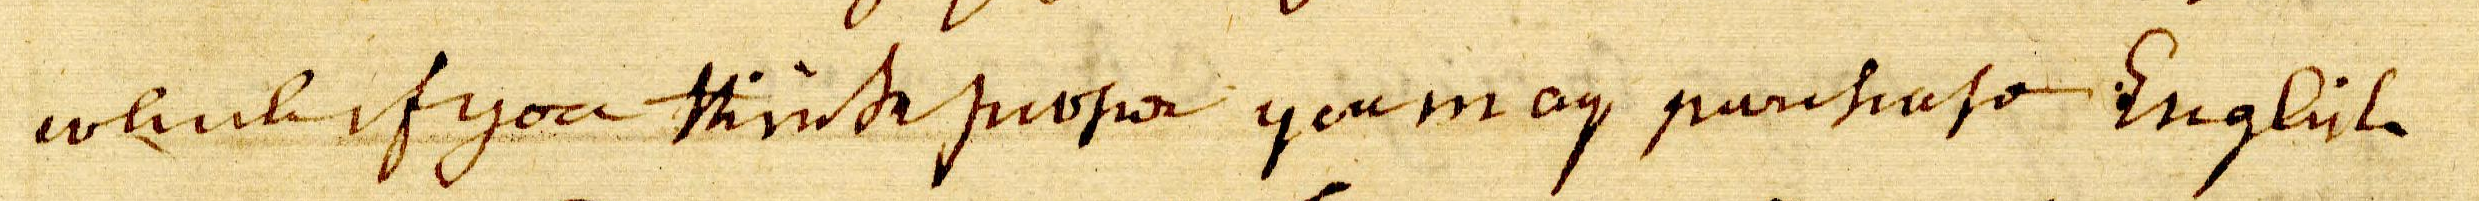which if you think proper you may purchase English
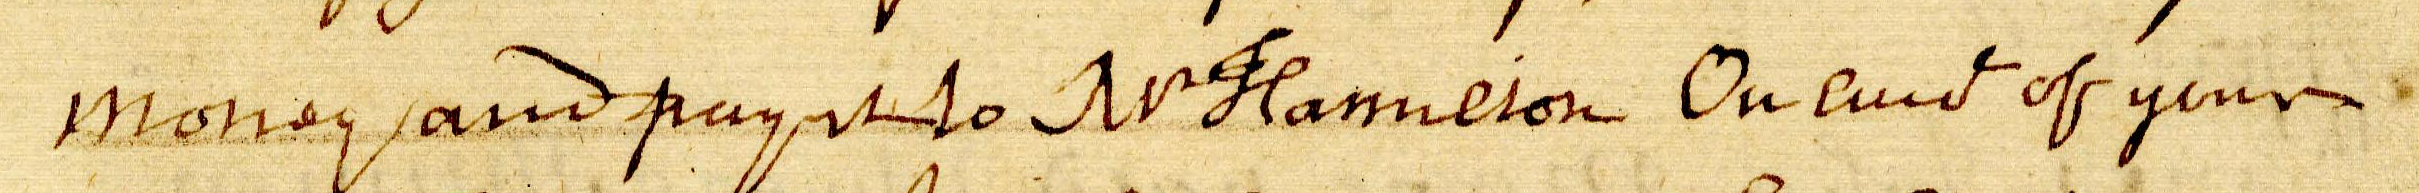Money and pay it to M^r Hamilton On Acco^t of your
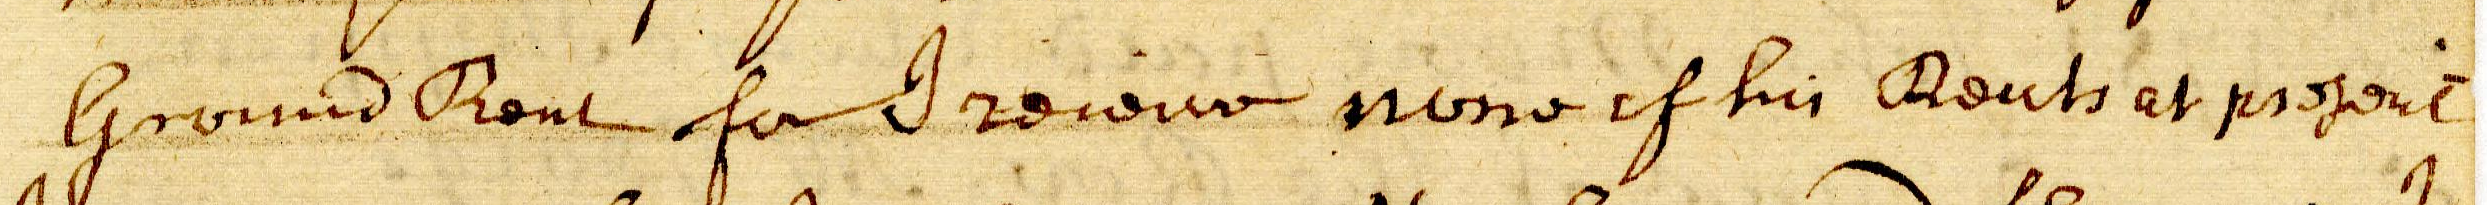Ground Rent for I receive none of his Rents at present
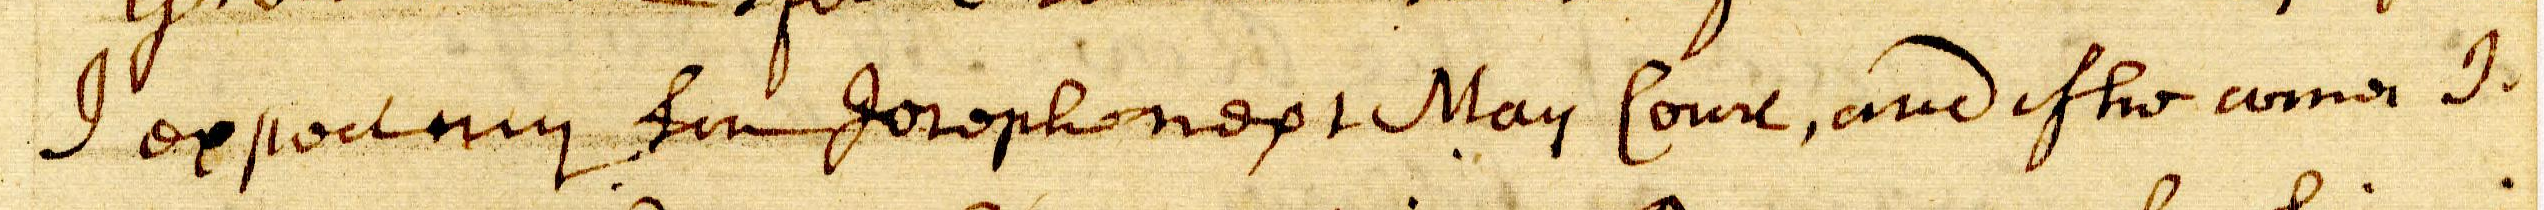I expect my Son Joseph next May Court, and if he comes I
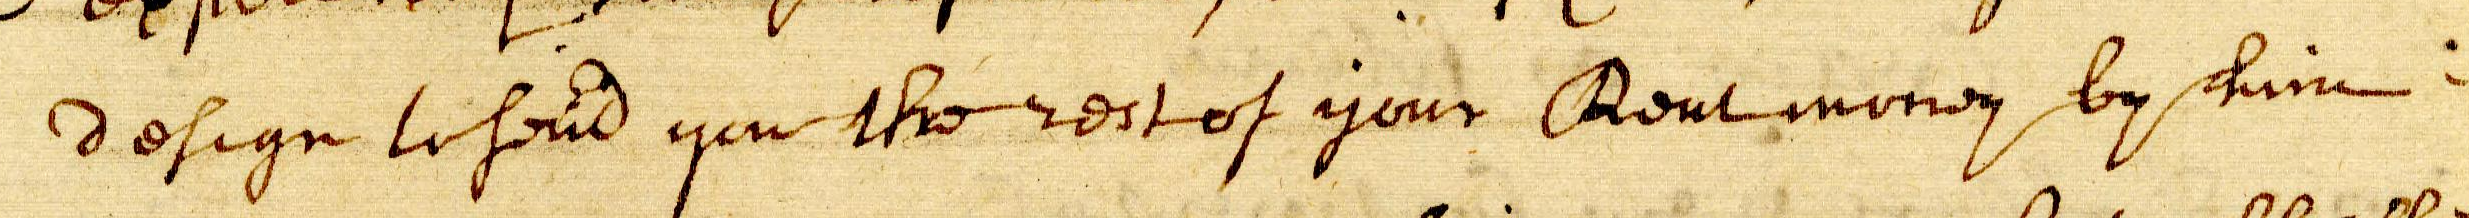design to send you the rest of your Rent money by him
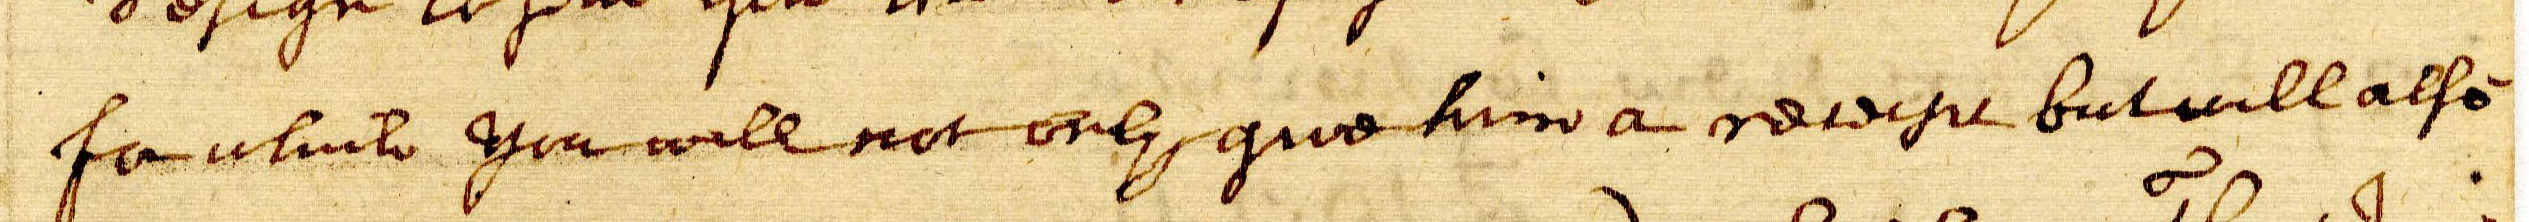for which You will not only give him a receipt but will also
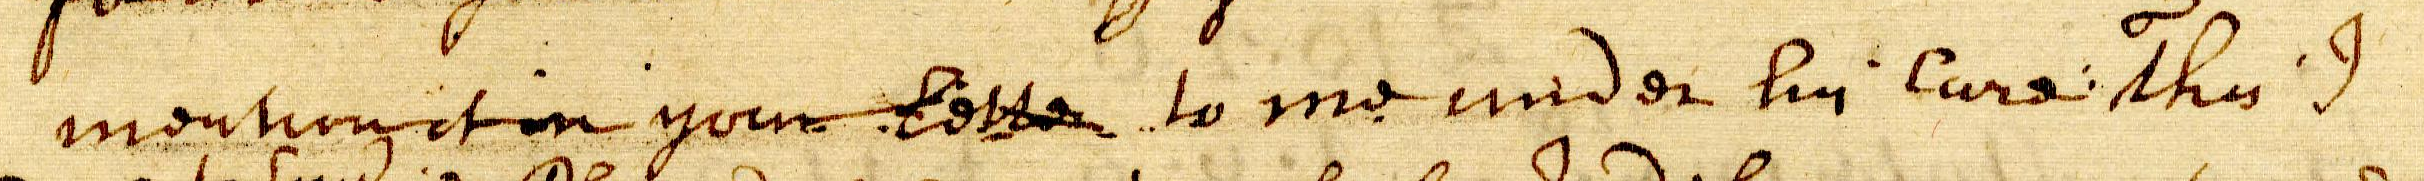mention it in your letter to me under his Care: this I
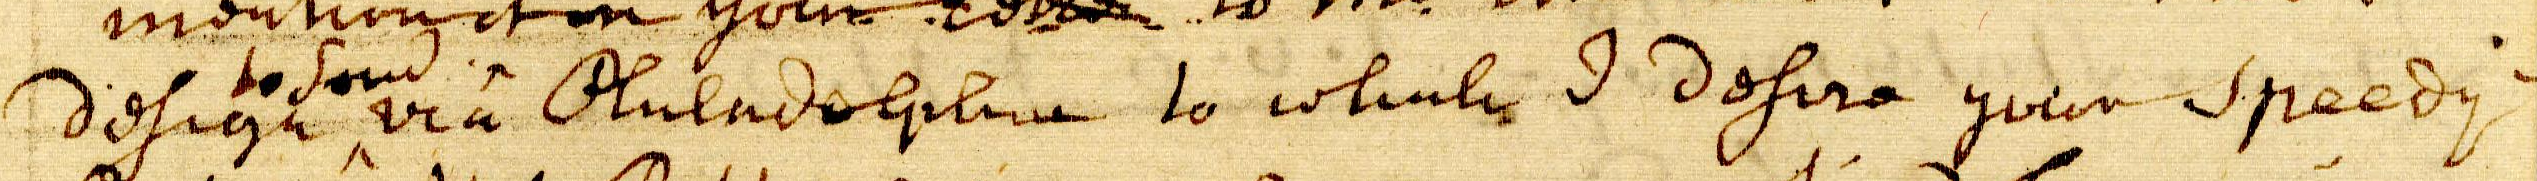design ^ via Philadelphia to which I desire your speedy-
